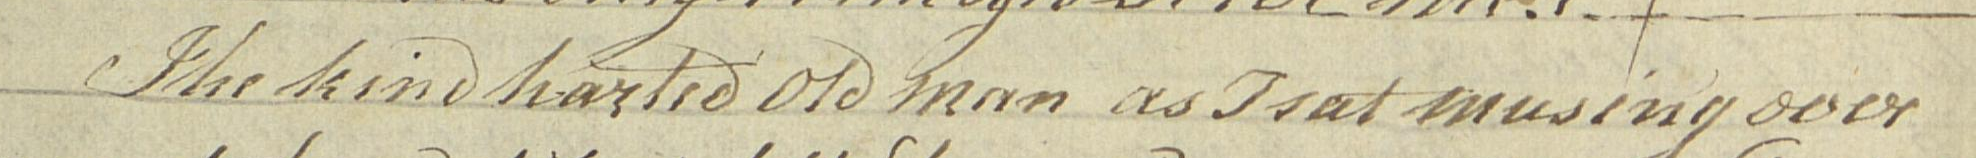The kind harted old man as I sat musing over
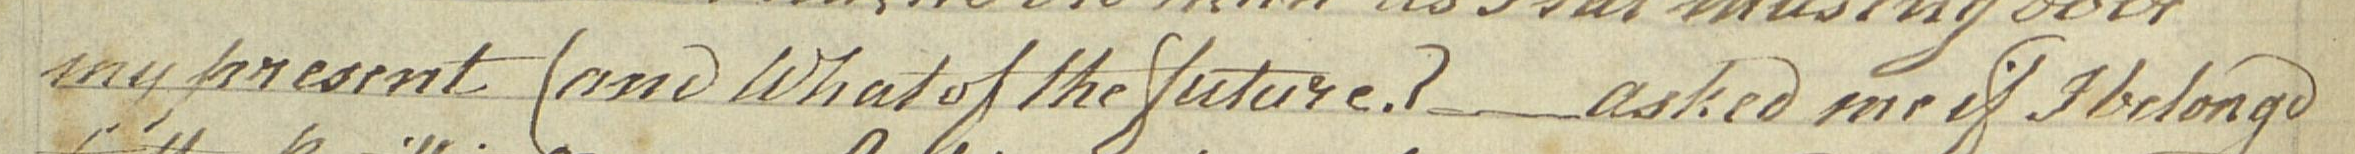my present (and What of the future? asked me if I belongd
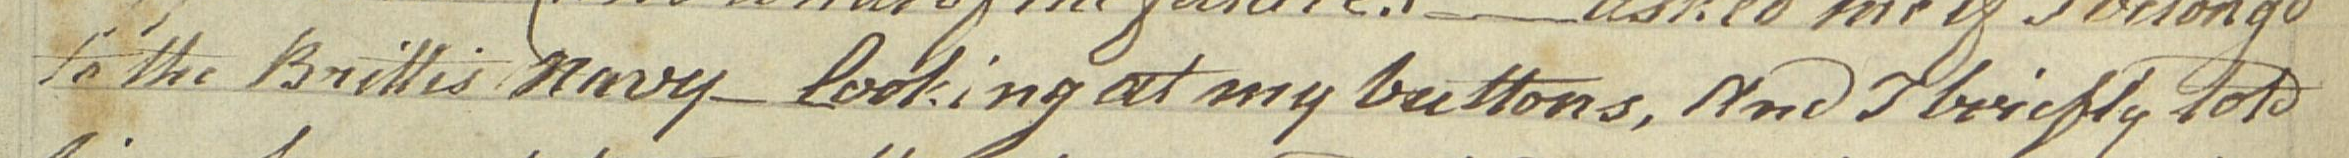to the Brittis Navy looking at my buttons, and I briefly told
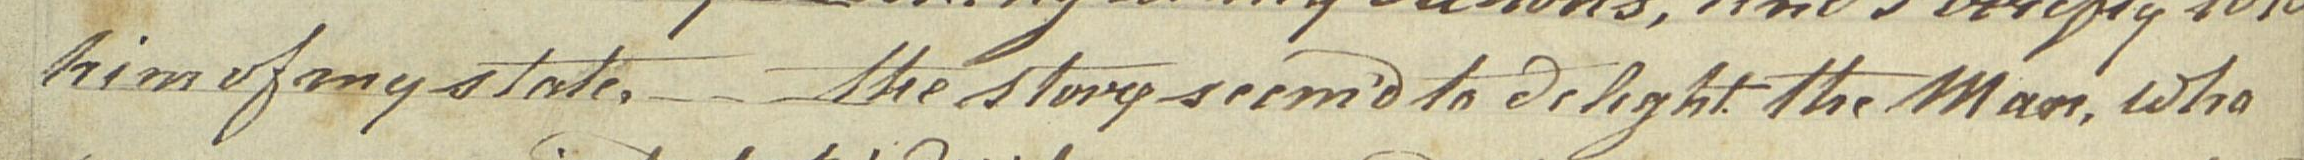him of my state. the story seem'd to delight the Man, who
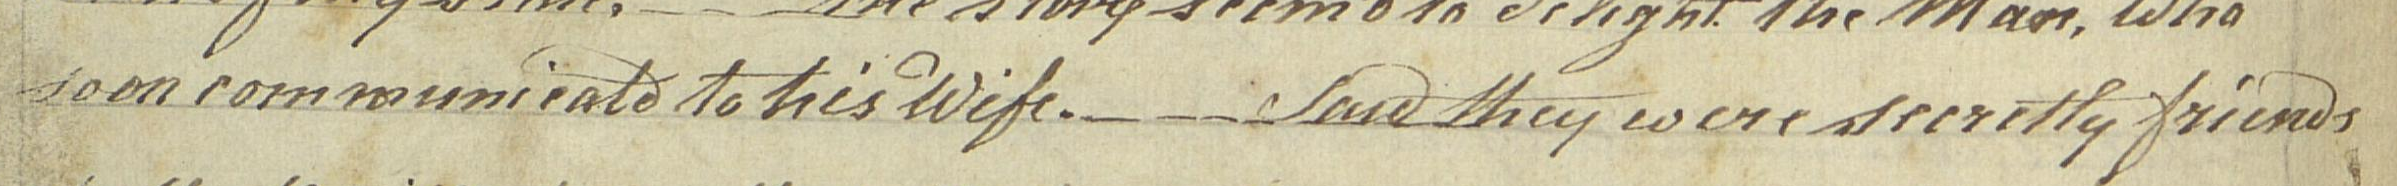soon communicated to his Wife. Said they were secretly friends
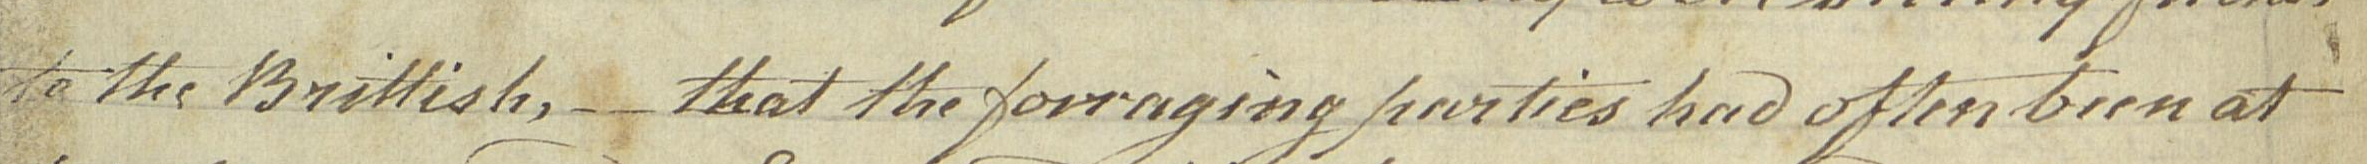to the Brittish, that the foraging parties had often been at
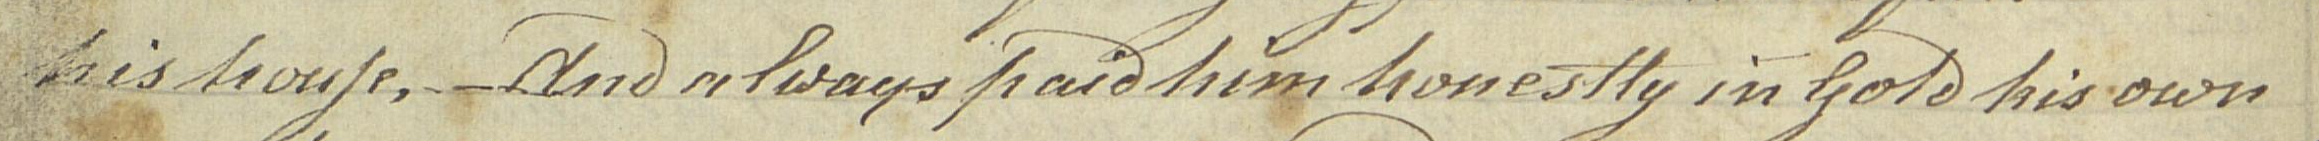his house, And always paid him honestly in Gold his own
